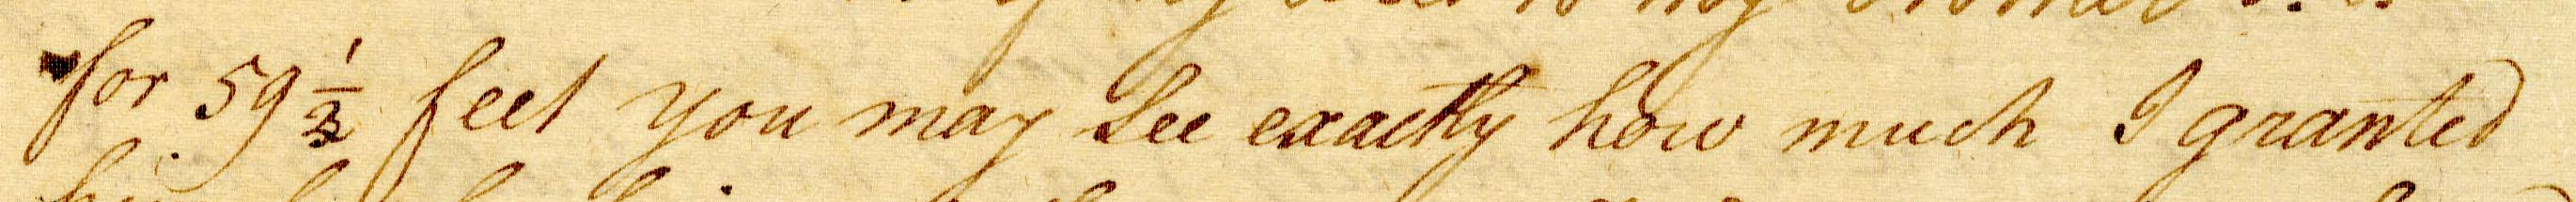for 59 1/2 feet you may see exactly how much I granted
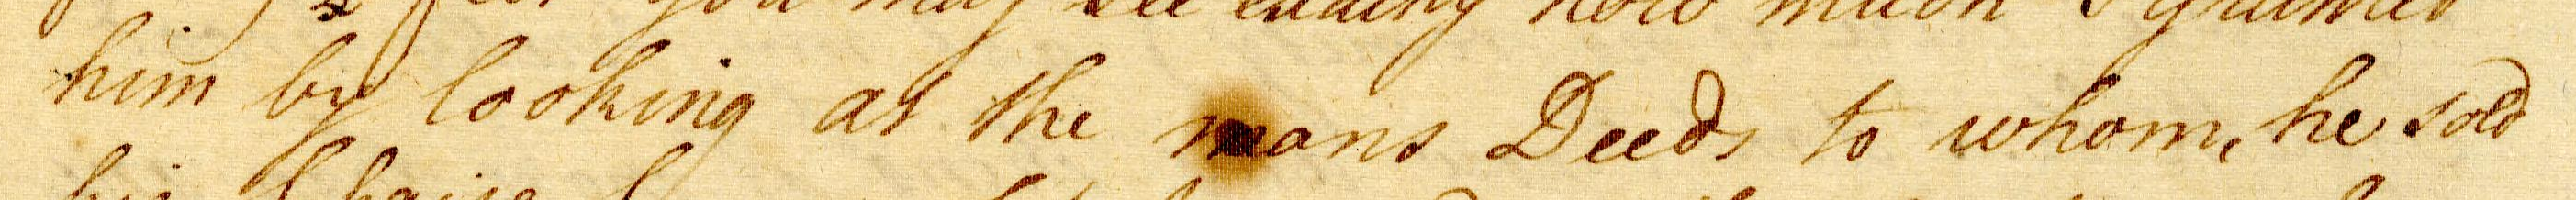him by looking at the mans Deeds to whom he sold
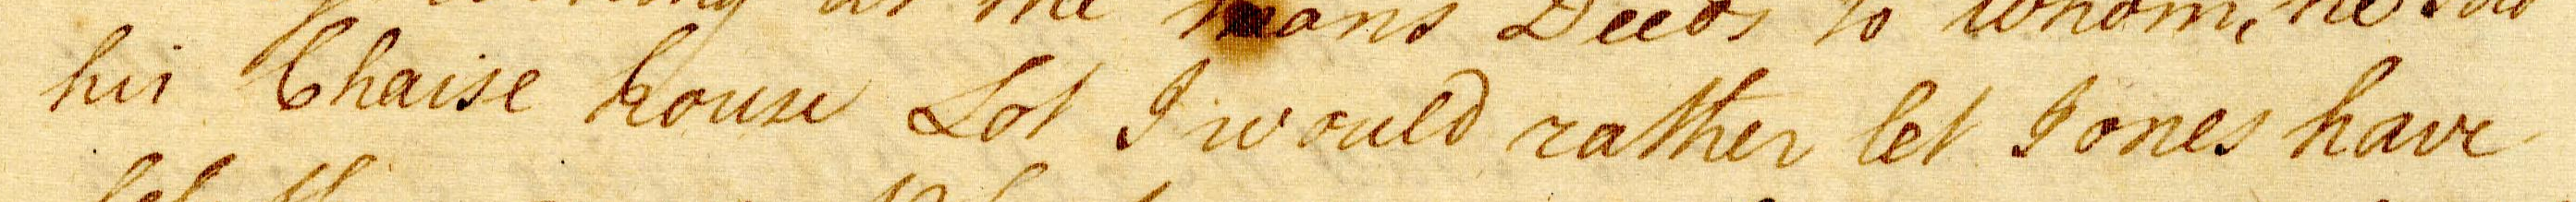his Chaise house Lot I would rather let Jones have
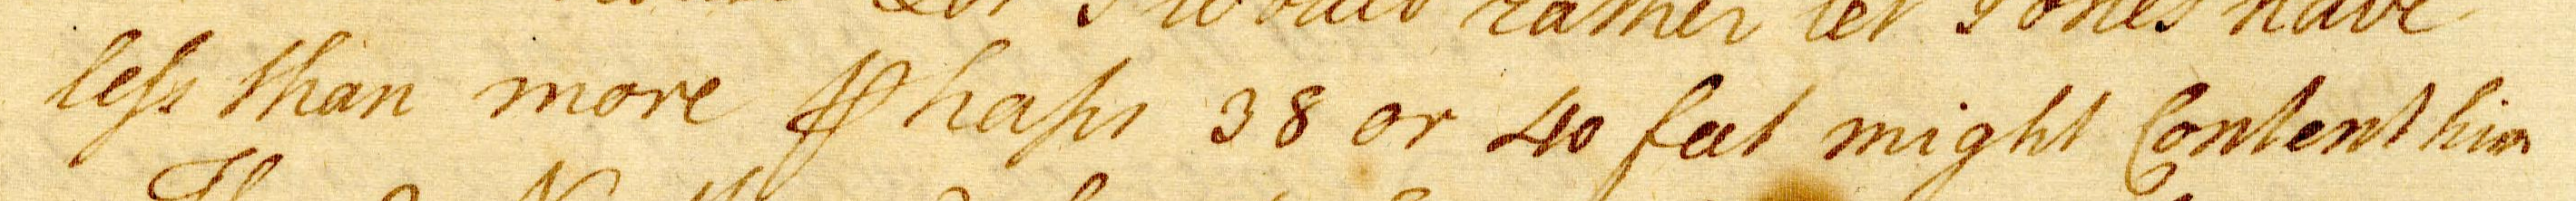less than more perhaps 38 or 40 feet might Content him
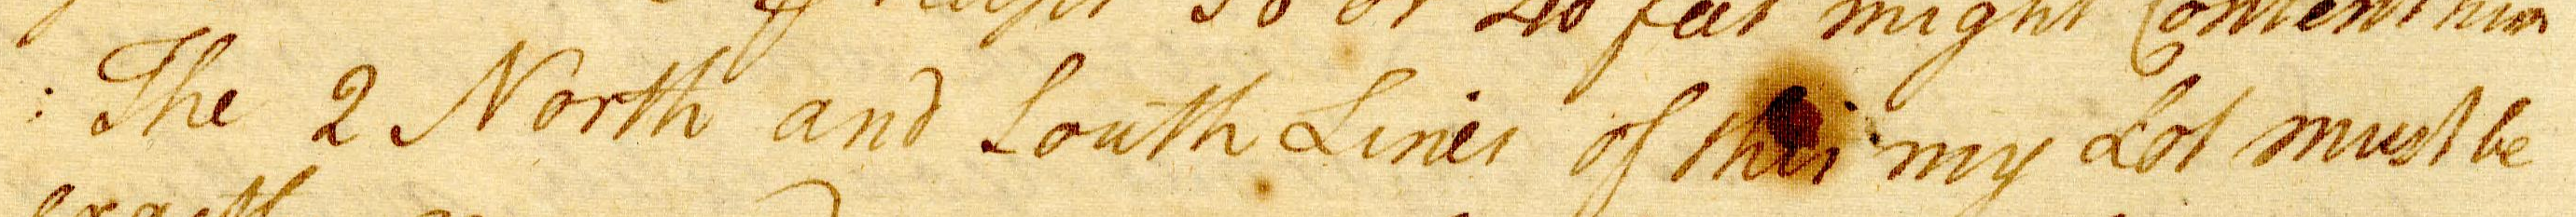:The 2 North and South Lines of this my Lot must be
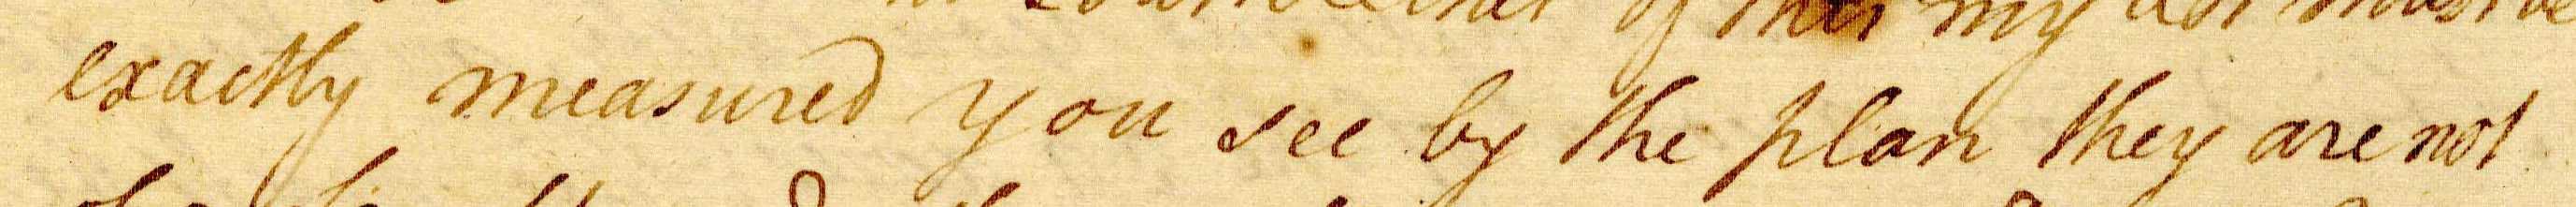exactly measured You see by the plan they are not
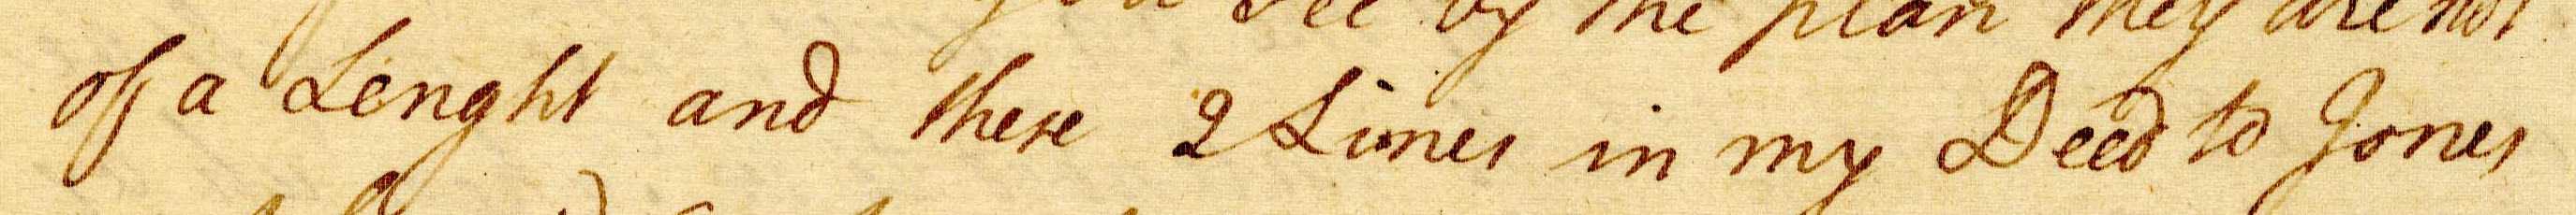of a Lenght and these 2 Lines in my Deed to Jones
